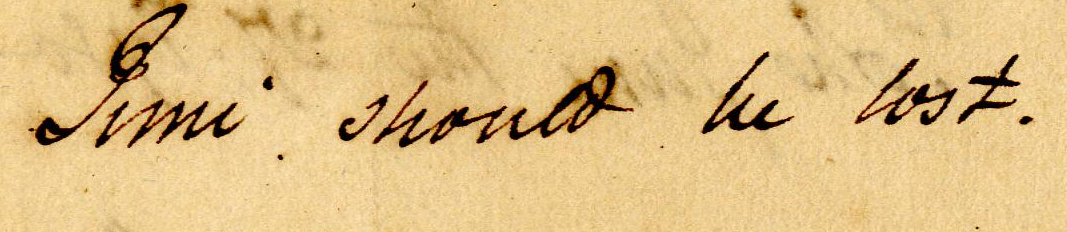Time should be lost.
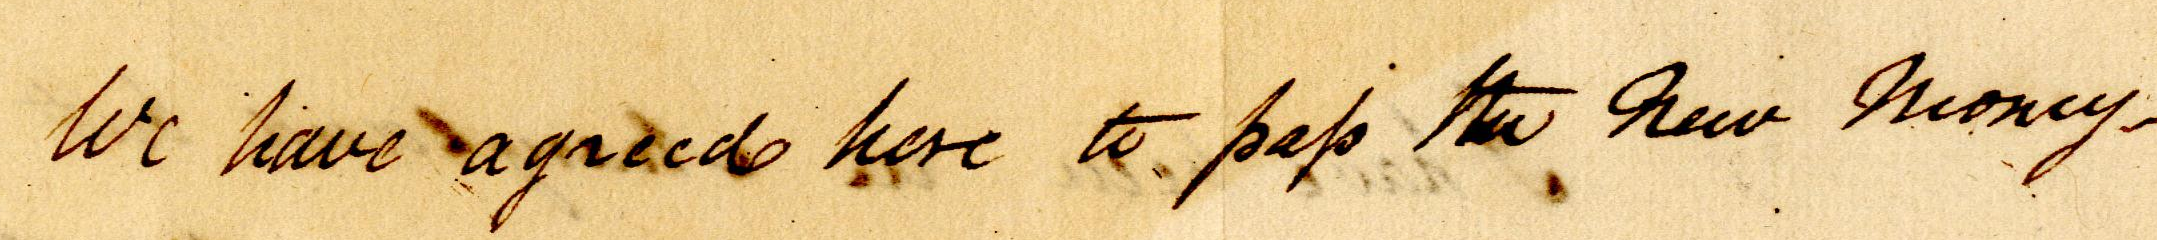We have agreed here to pass the new money
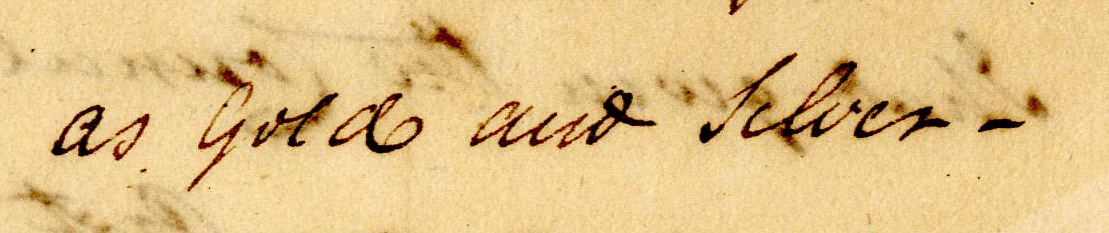as Gold and Silver-
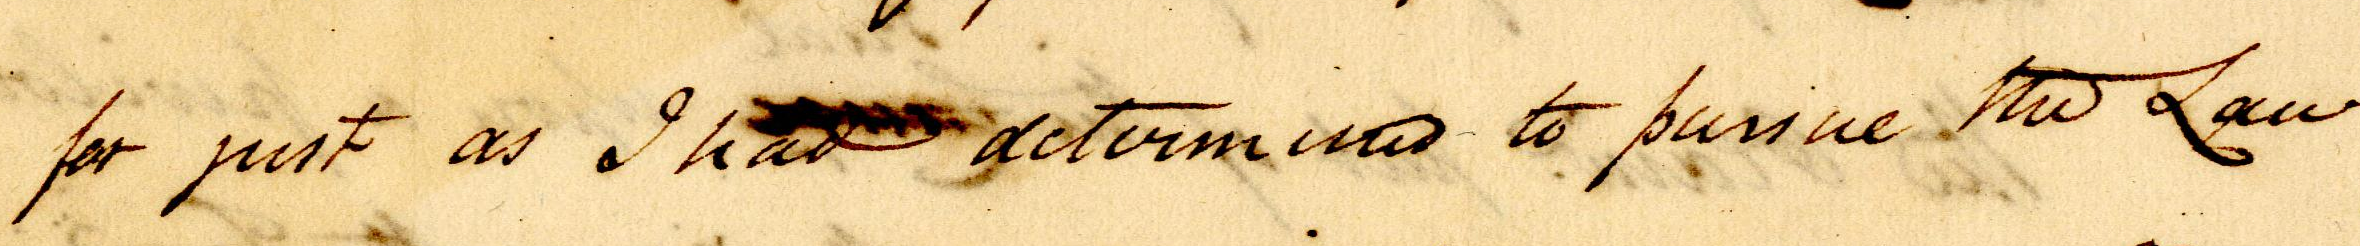for just as I had determined to pursue the Law
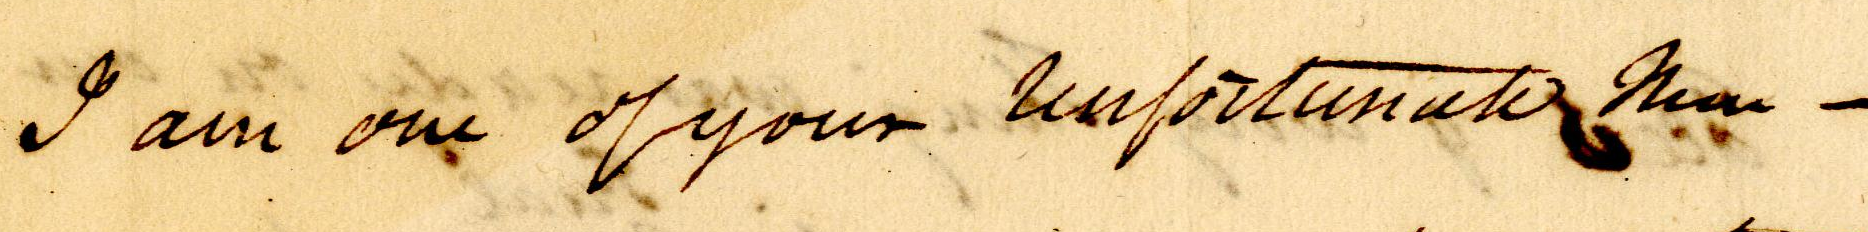I am one of your unfortunate New
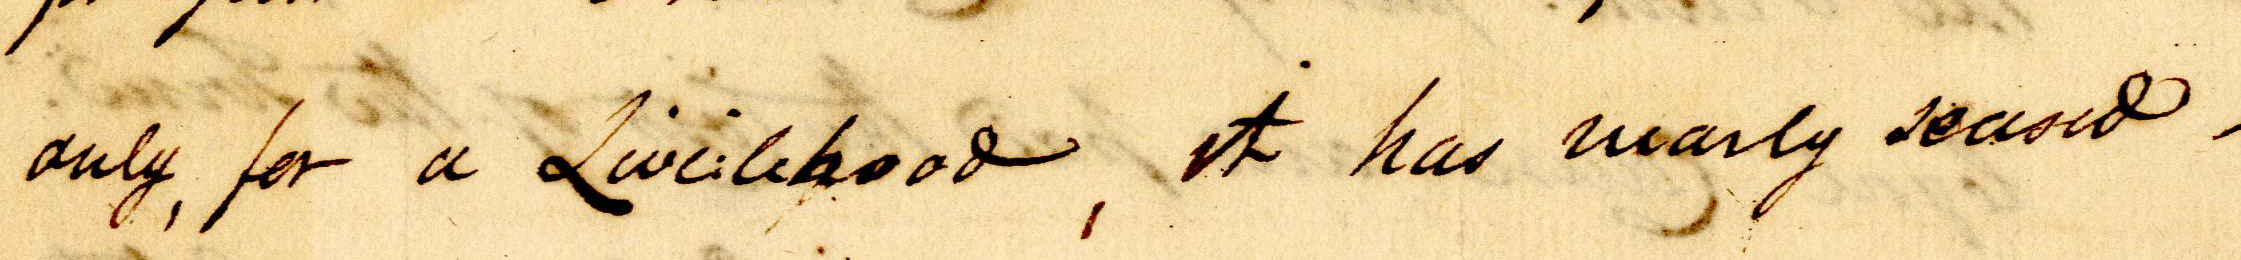only, for a Livelihood it has nearly seased
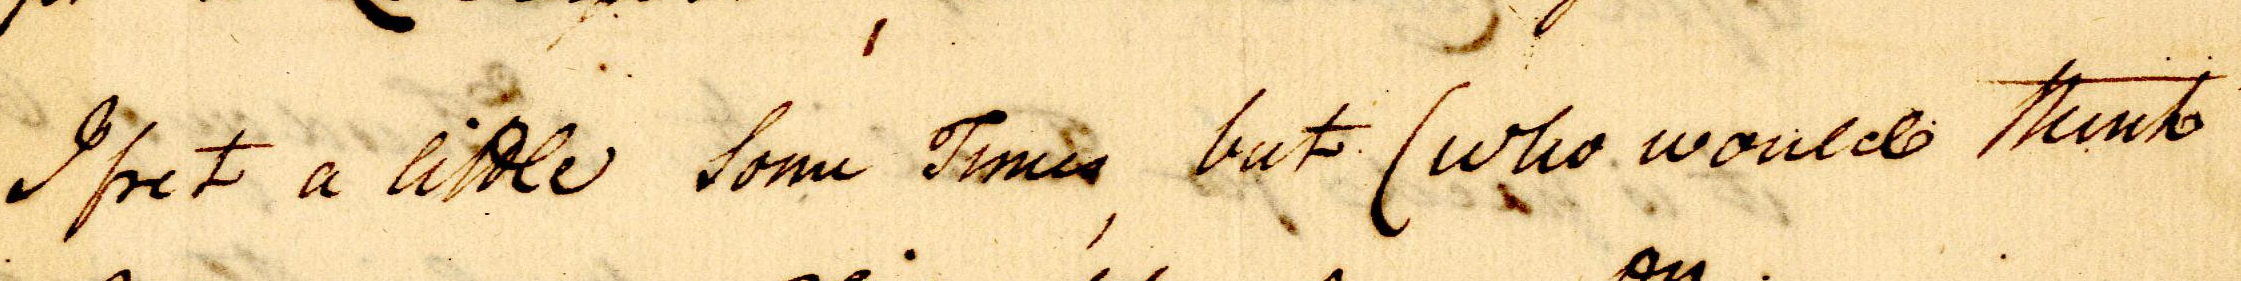I fret a little some Times but (who would think
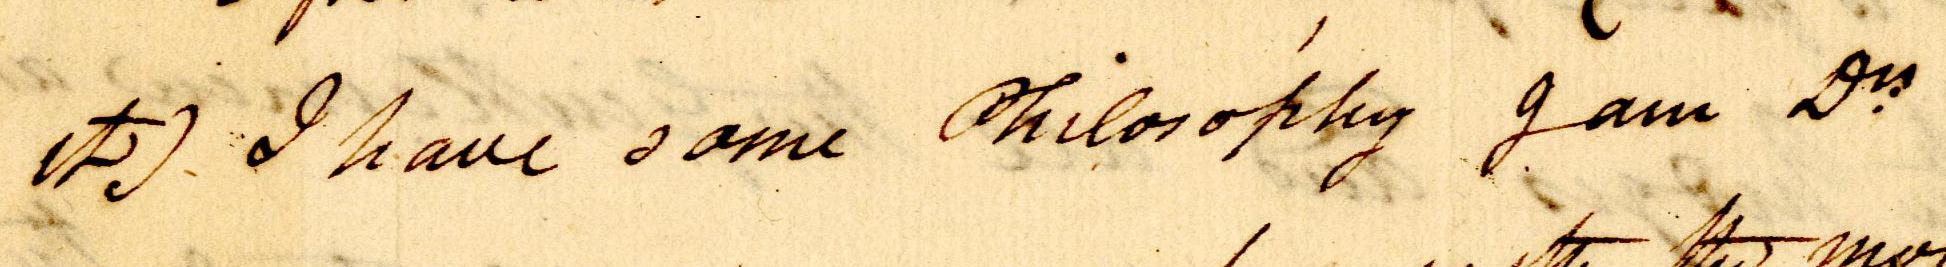it). I have some Philosophy I am D^r.
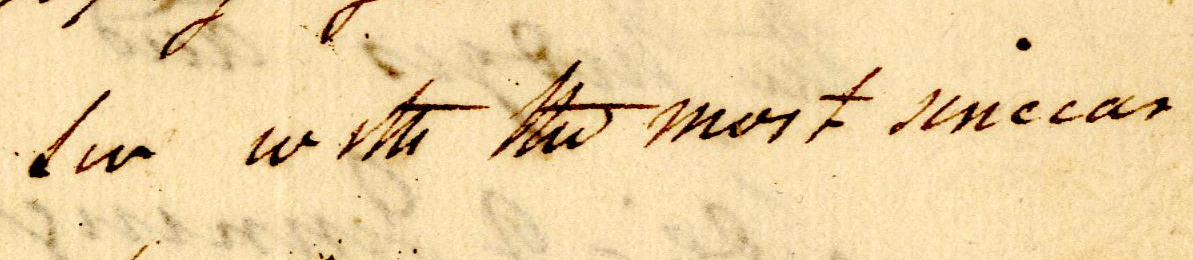Sir with the most sincear
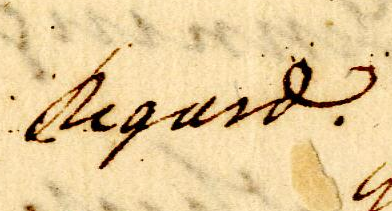regard.
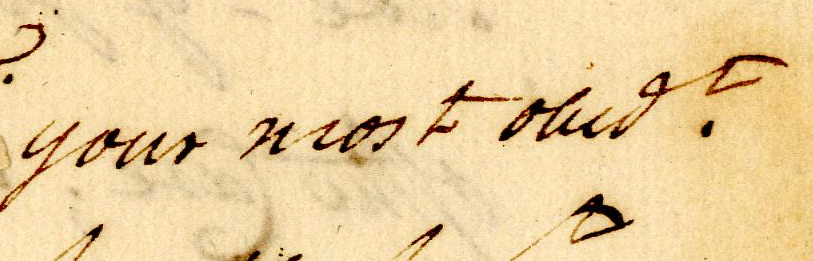your most obed^t.
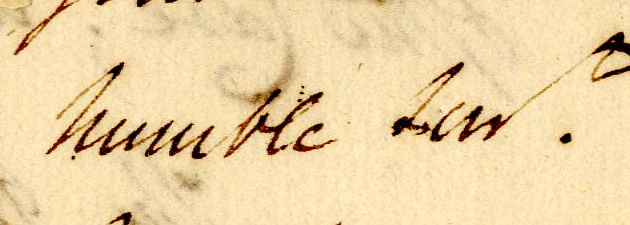humble Serv^t.
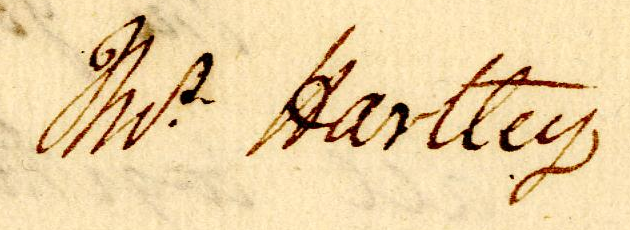Tho^s. Hartley
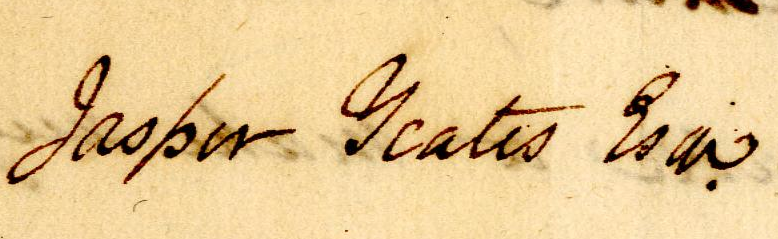Jasper Yeates Esq^r.
